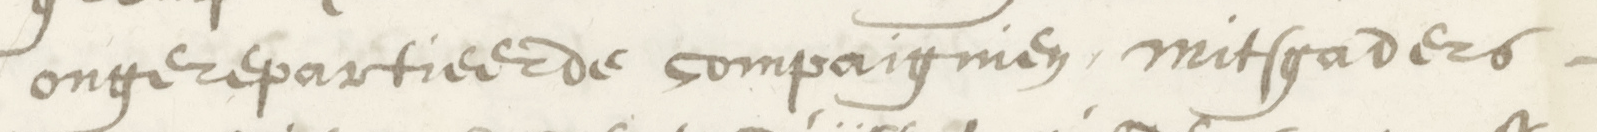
ongerrepartieerde compaignen, mitsgaders
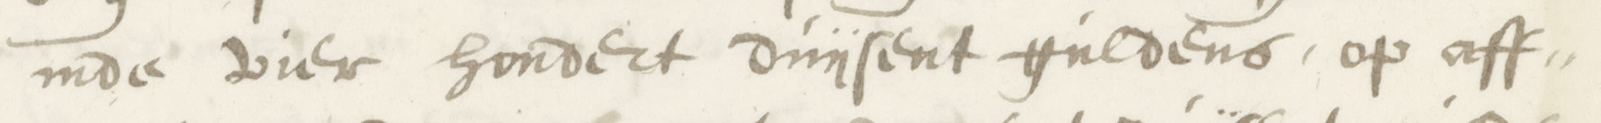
inde vier hondert duijsent guldens, op aff„
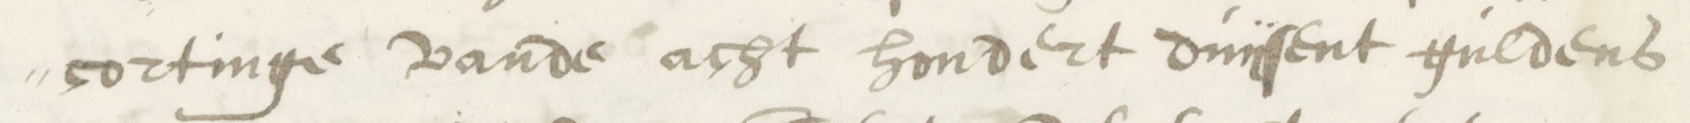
,,cortinge vande acht honder duijsent guldens
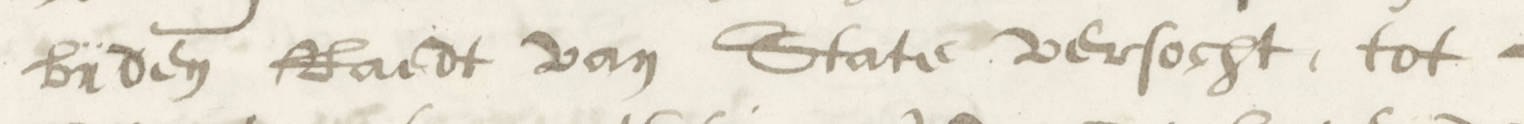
bijden Raedt van State versocht, tot
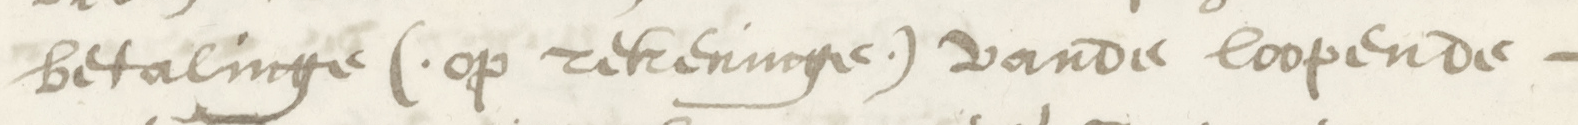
betalinge (.op rekeninge.) vande loopende
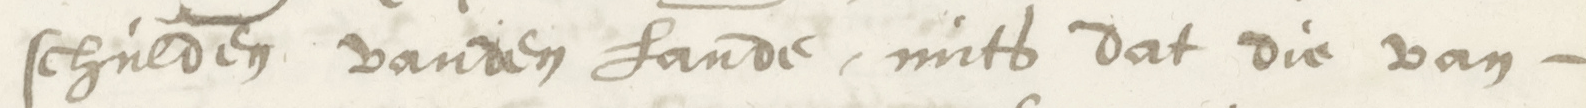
schulden vanden Lande, mits dat die van
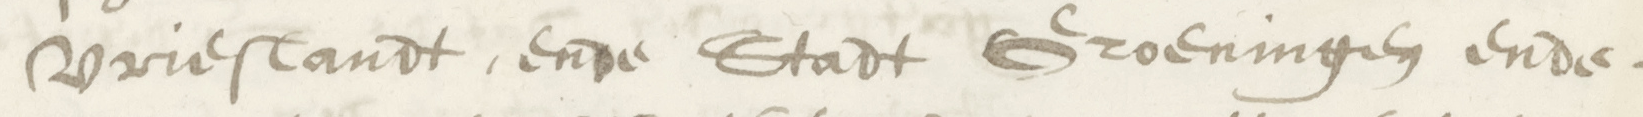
Vrieslandt, ende Stadt Groeningen ende
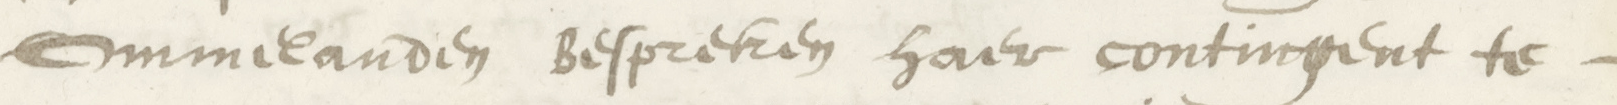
Ommelanden bespreken haer contingent te
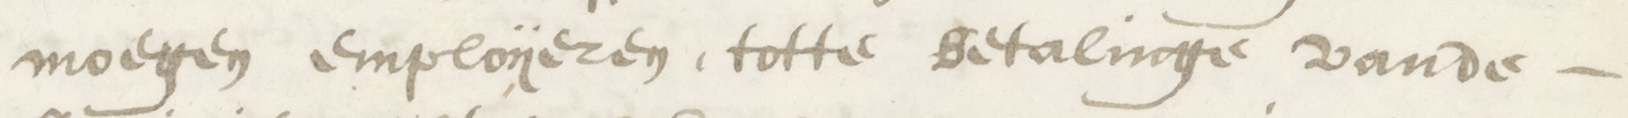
moegen emploijeren, totte betalinge vande
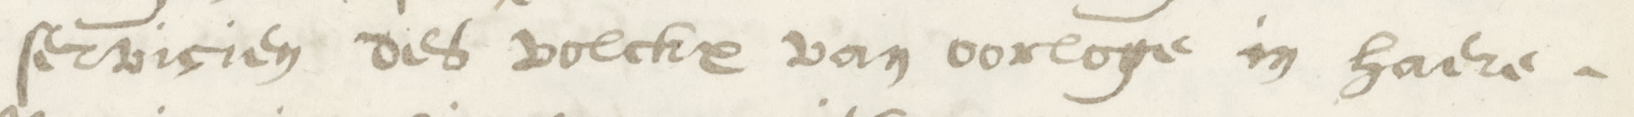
servicien des volcke van oorloge in haere
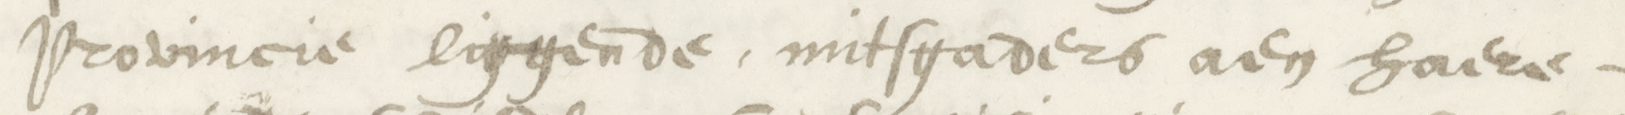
Provincie liggende, mitsgaders aen haere
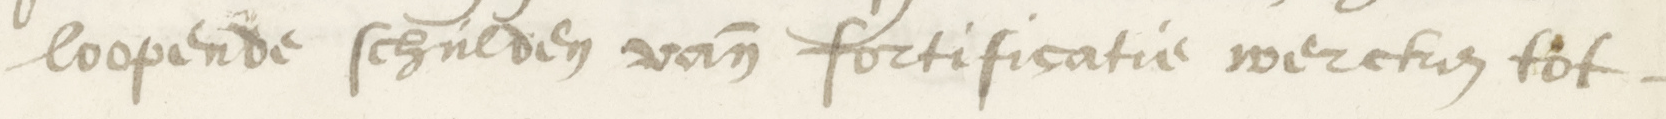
loopende schulden van fortificatie wercken tot
